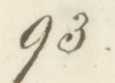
93.
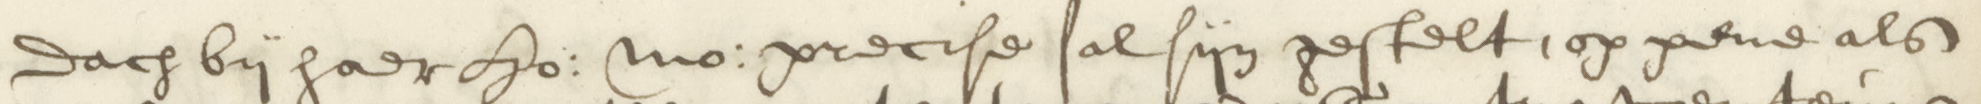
Dach bij haer Ho:Mo: precise sal sijn gestelt, op pene als
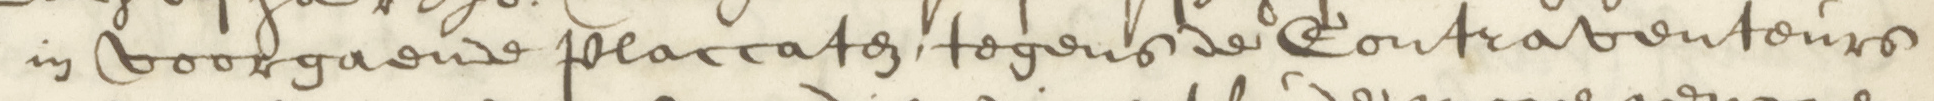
in voorgaende placcaten, tegens de Contraventeurs
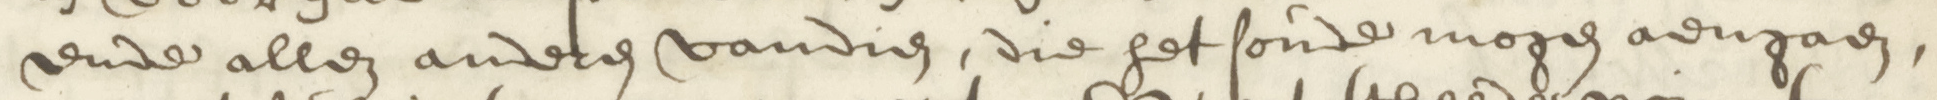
ende allen anderen vandien, die het soude mogen aengaen,
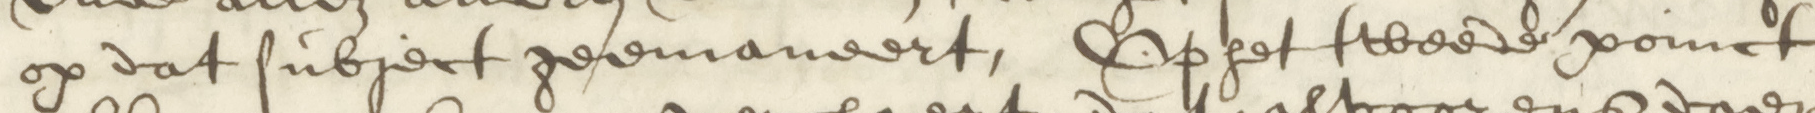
op dat subject geemaneert, Op het tweede poinct
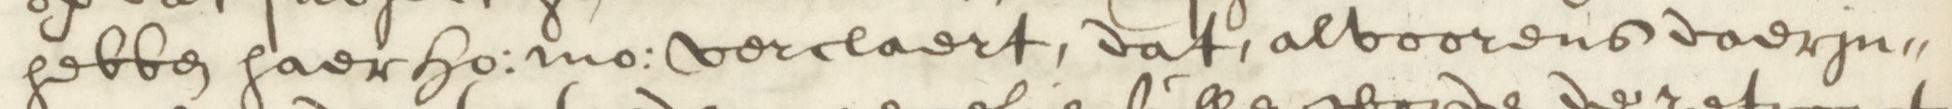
hebben haer Ho:Mo: verclaert, dat, alvoorens daerin„
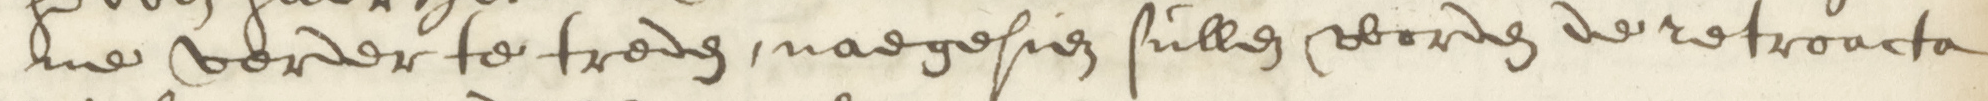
ne verder te treden, naegesien sullen worden de retroacta
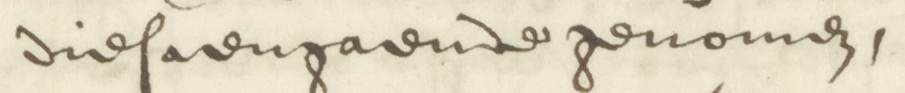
diesaengaende genomen.
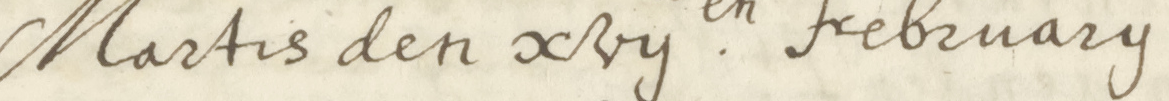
Martis den xviien. Februarij
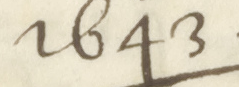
1643.
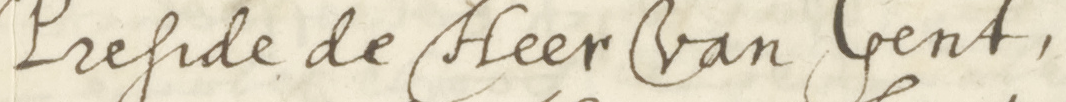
Preside de Heer van Gent,
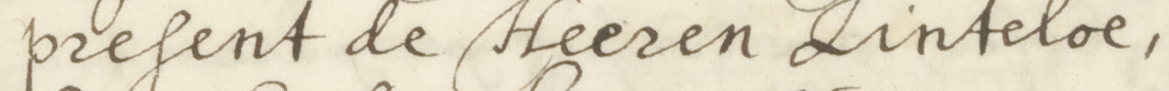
present de Heeren Linteloe,
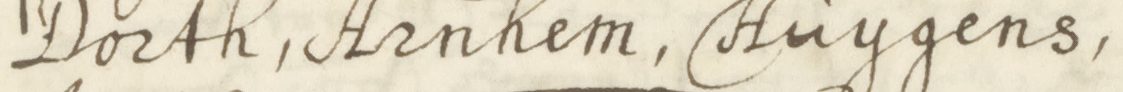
Dorth, Arnhem, Huijgens,
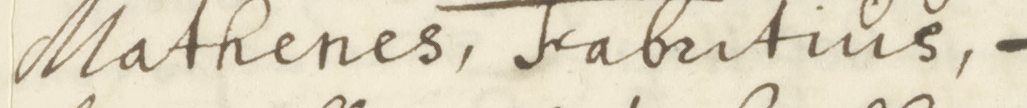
Mathenes, Fabritius, —
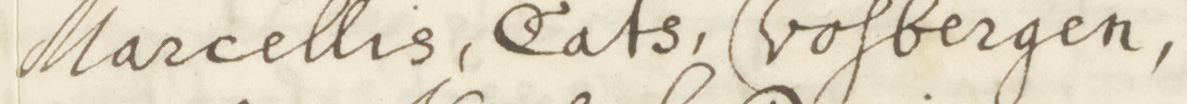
Marcellis, Cats, Vosbergen,
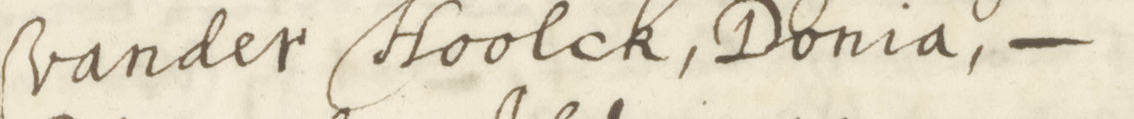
vander Hoolck, Donia, —
